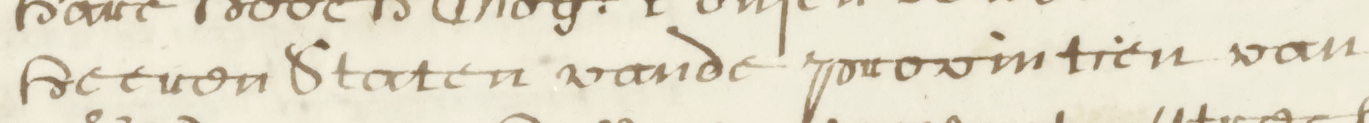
heeren Staten vande provintien van
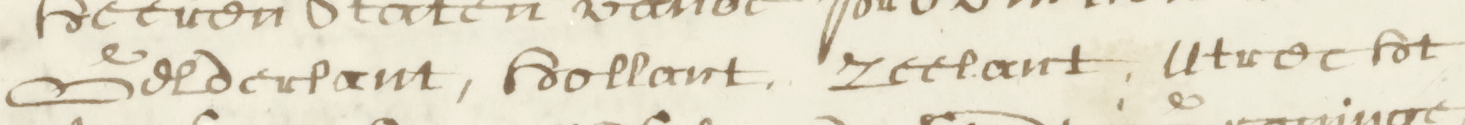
Gelderlant, Hollant, Zeelant, Utrecht
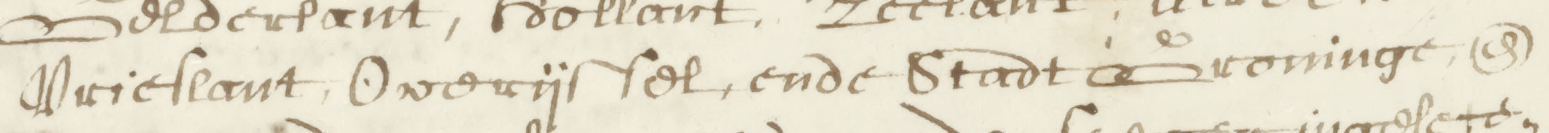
Vrieslant, Overijssel, ende Stadt Groninge, &
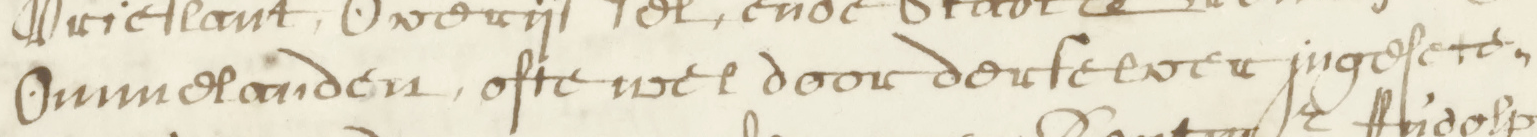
Ommelanden, ofte wel door derselver ingesete,,
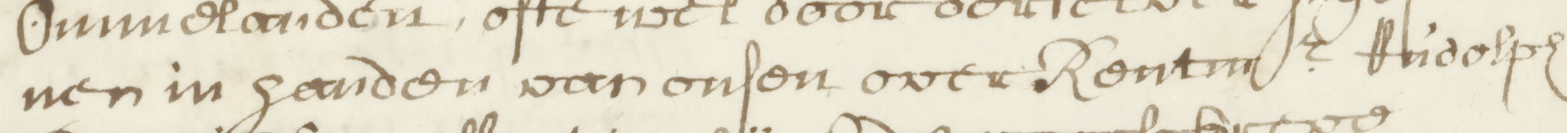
nen in handen van onsen over Rentmr. Rudolph
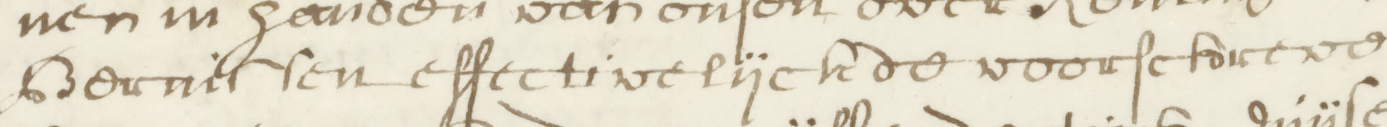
Bernissen effectivelijck de voorschreve
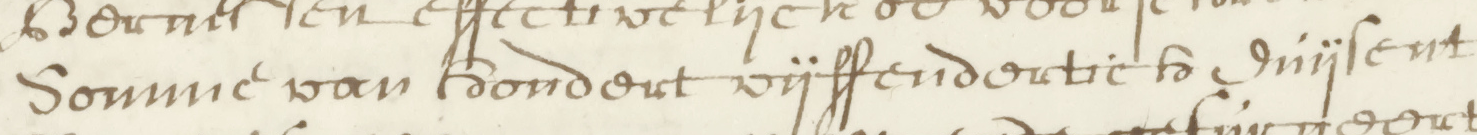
Somme van hondert vijffendertich Duijsent
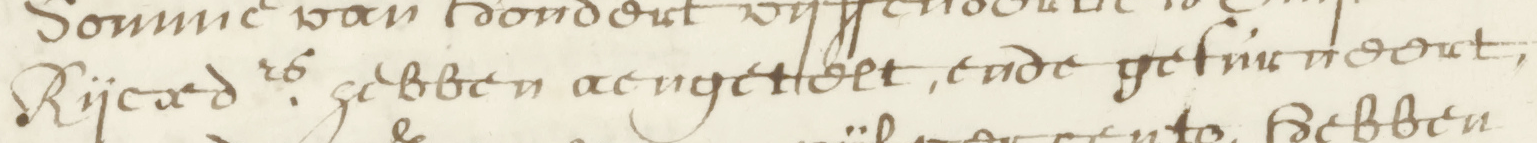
Rijcxdrs. hebben aengetelt, ende gefurneert,
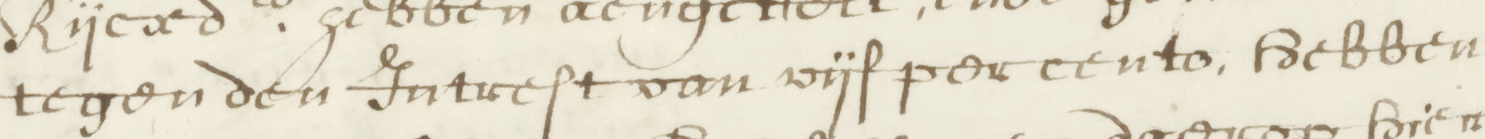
tegen den Intrest van vijf percento, hebben
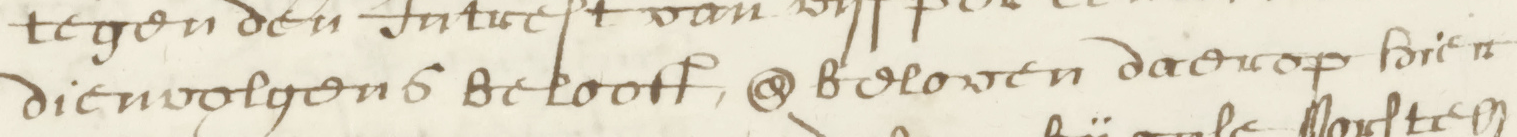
dienvolgens belooft, & beloven daerop hier
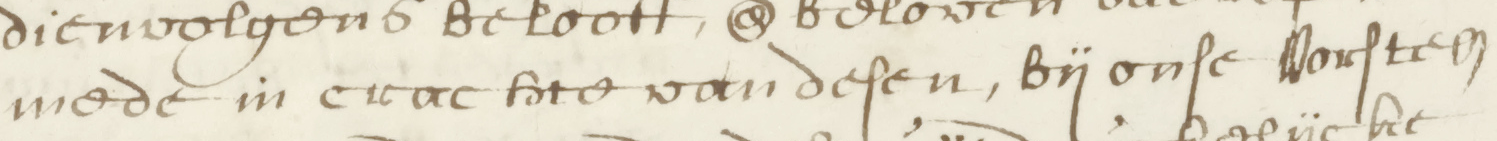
mede in crachte van desen, bij onse Vorstel
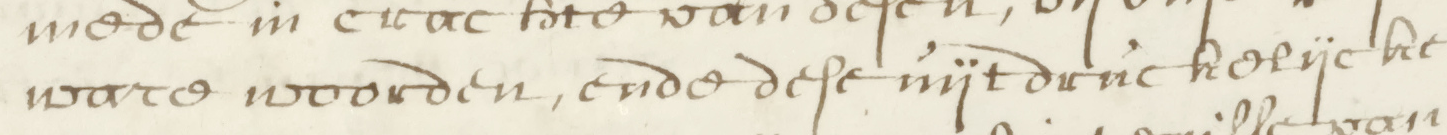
ware woorden, ende dese uijtdruckelijcke
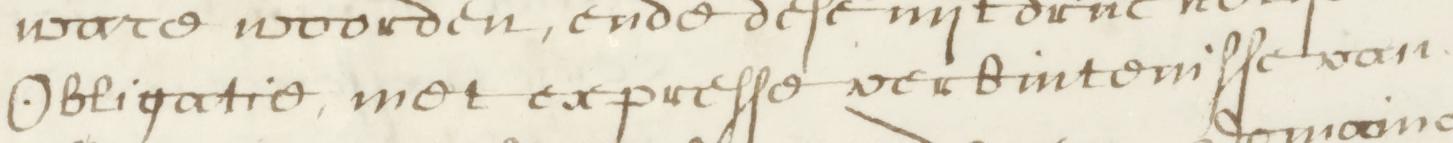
Obligatie, met expresse verbintenisse van
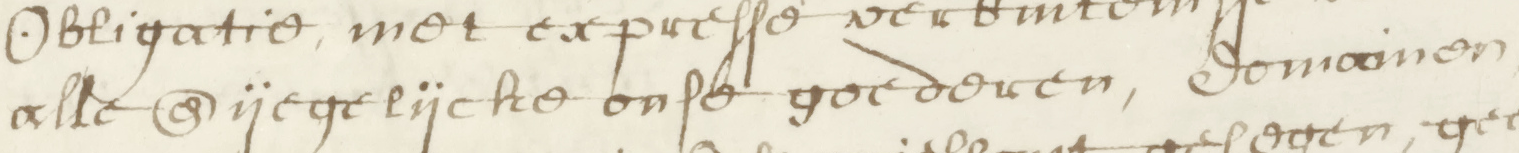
alle & ijegelijcke onse goederen, Domainen,
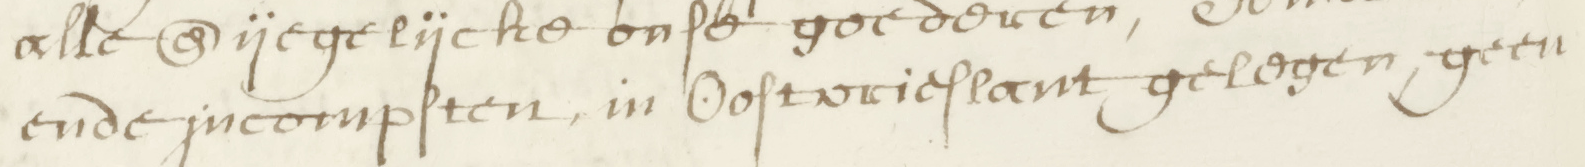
ende incompsten, in Oostvrieslant gelegen, geen
